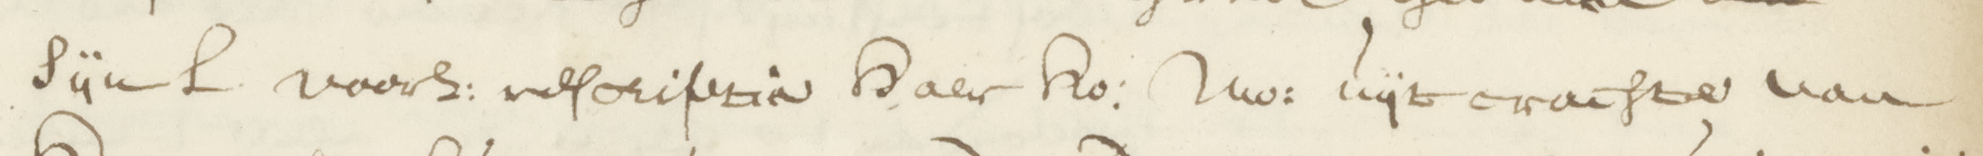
sijn L. voorz: rescriptie Haer Ho:Mo: uijt crachte van
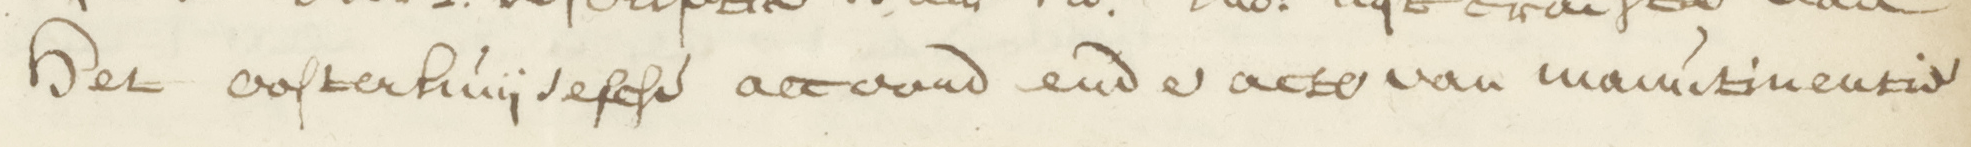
het Oosterhuijsesche accoord ende acte van maintinentie
